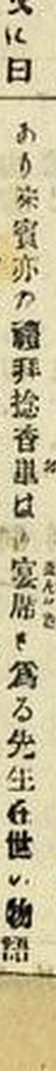あり來賓亦の禮拜捻香畢は宴席爲る先生在世の物語
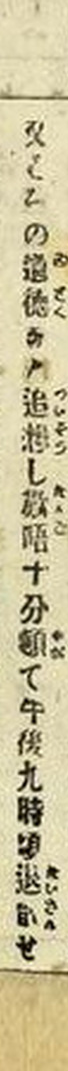又はの遺德なと追想し歎唔十分頓て午後九時頃退散せ
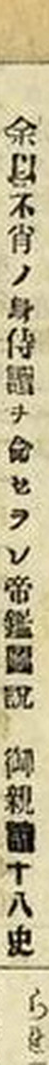余以不肖ノ身侍讀ヲ命セラレ帝鑑圖説御親十八史
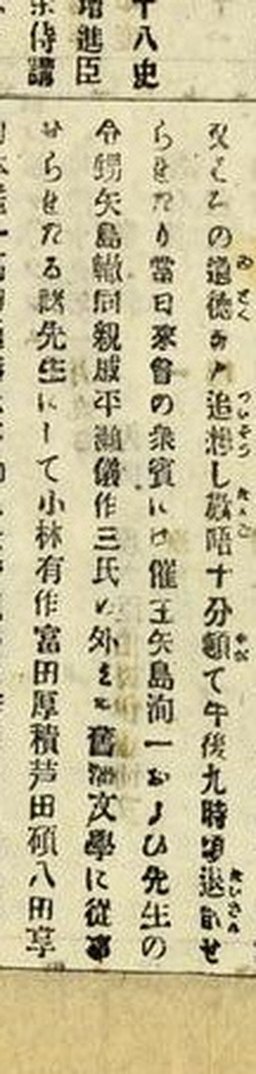令甥矢島轍同親戚平瀬儀作三氏の外舊藩文學に從事
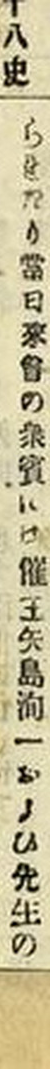られたり當日來會の衆賓には催主矢島洵一およひ先生の
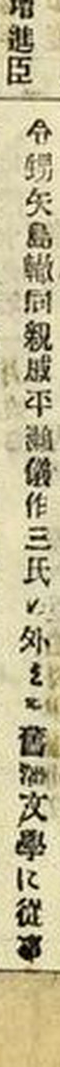令甥矢島轍同親戚平瀬儀作三氏の外舊藩文學に從事
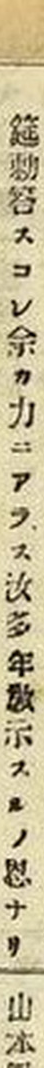筵勅答スコレ余カ力ニアラス汝多年教示スルノ恩ナリ
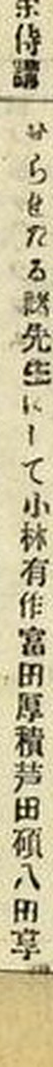せられたる諸先生にして小林有作富田厚積芦田碩八田享
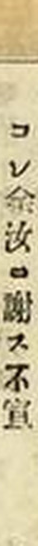コレ余汝ニ謝ス不宣
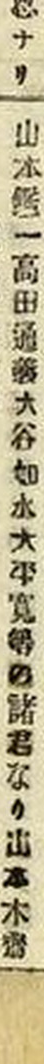山本鑑一高田通義大谷如水大平寛等の諸君なり山本木齋
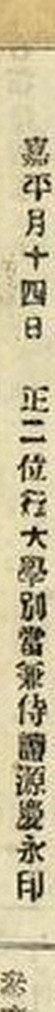嘉平月十四日正二位行大學別當兼侍讀源慶永印
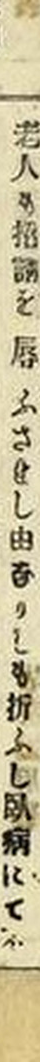老人も招請を辱ふさせし由なりしも折ふし臥病にて不
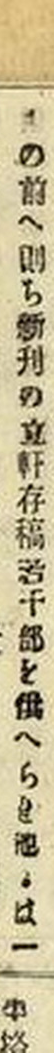この前へ則ち新刊の立軒存稿若干部を供へられ他には一
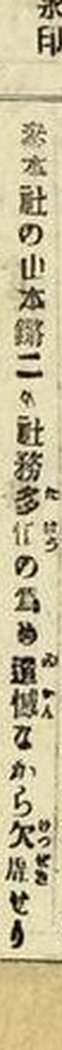來本社の山本鏘二も社務多忙の爲め遺憾なから欠席せり
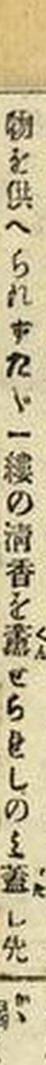物を供へられすたゞ一縷の清香を薫せられしのみ蓋し先
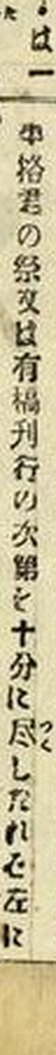平格君の祭文は有稿刊行の次第を十分に尽したれば左に
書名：温古集 四巻
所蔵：福井県文書館 Fukui Prefectural Archives
